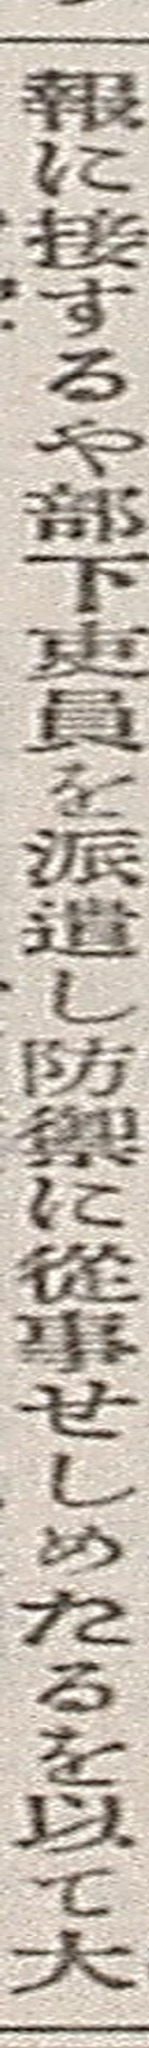報に接するや部下吏員を派遣し防禦に従事せしめたるを以て大
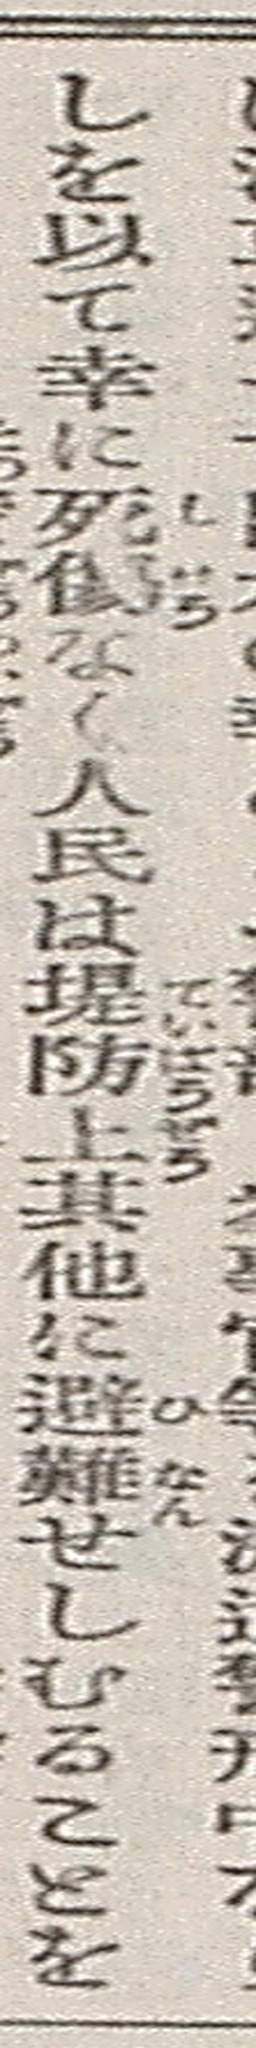しを以て幸に死傷なく人民は堤防上其他に避難せしむることを
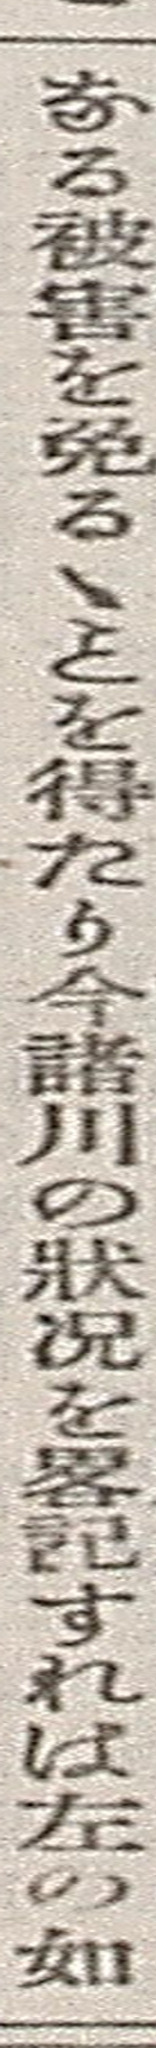なる被害を免るゝことを得たり今諸川の状況を畧記すれば左之如
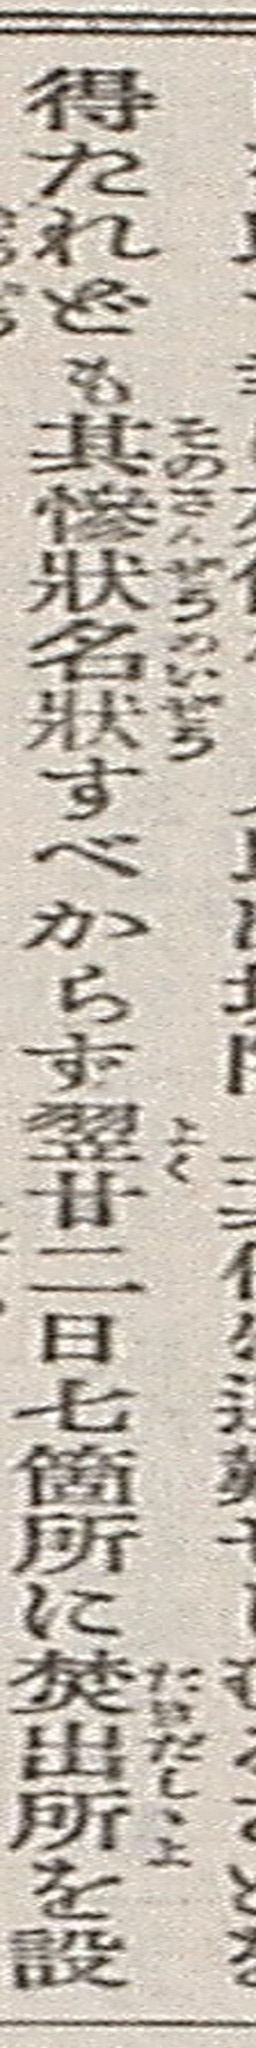得たれども其惨状名状すべからず翌廿二日七箇所に炊出所を設
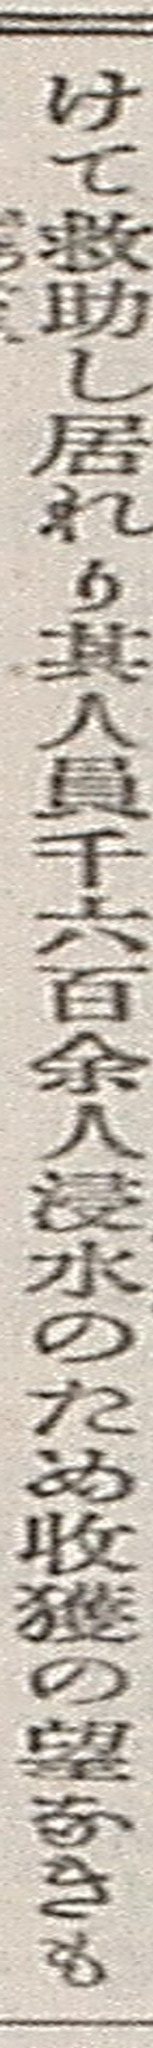けて救助し居れり其人員千六百余人浸水のため収穫の望なきも
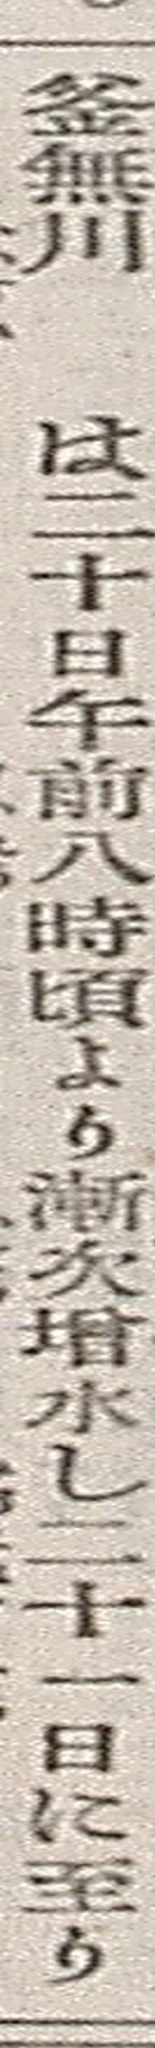釜無川は二十日午前八時頃より漸次増水し二十一日に至り
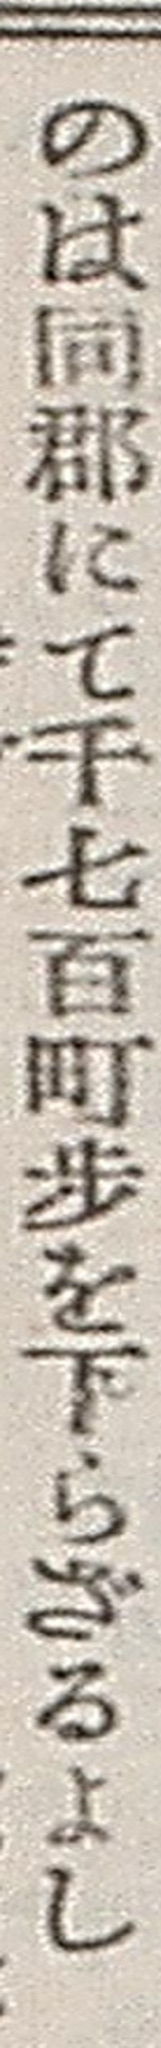のは同郡にて千七百町歩を下らざるよし
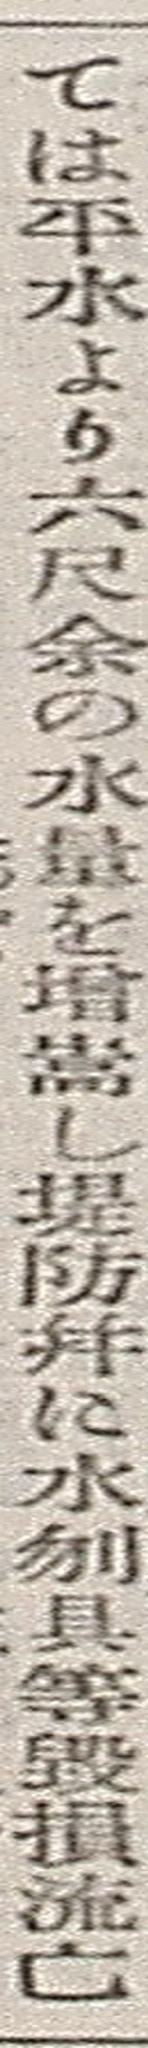ては平水より六尺余の水量を増嵩し堤防并に水刎具等毀損流亡
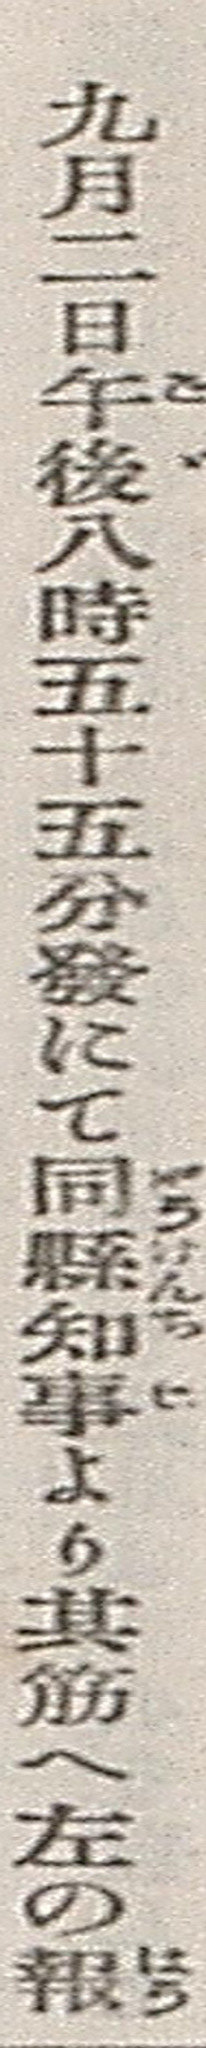九月二日午後八時五十五分発にて同県知事より其筋へ左の報
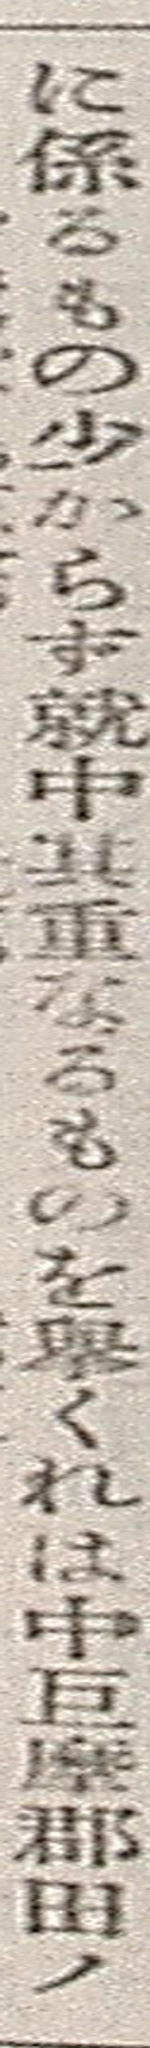に係るもの少からず就中其重なるものを挙くれは中巨摩郡田ノ
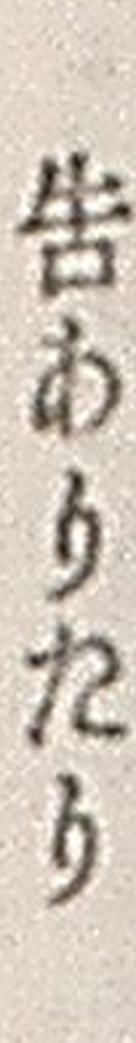告ありたり
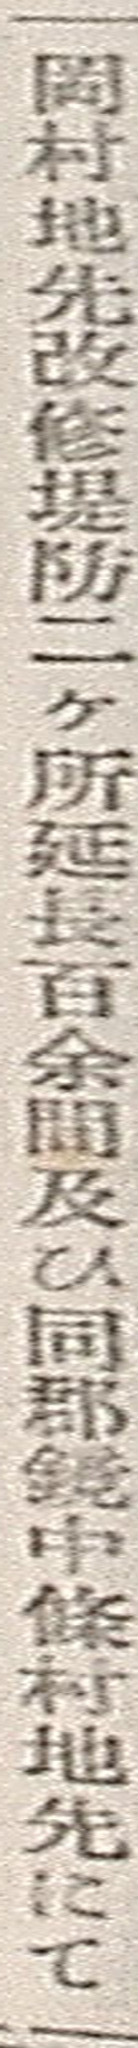岡村地先改修堤防二ヶ所延長百余間及び同郡鏡中條村地先にて
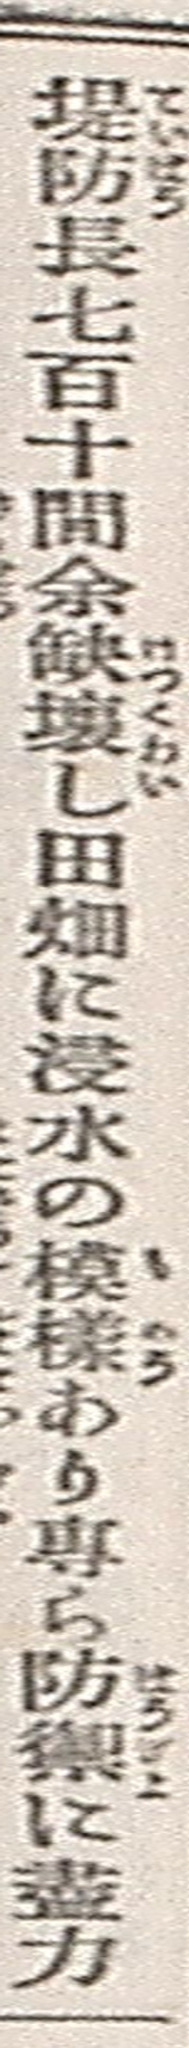堤防長七百十間余缺壊し田畑に浸水の模様あり専ら防禦に尽力
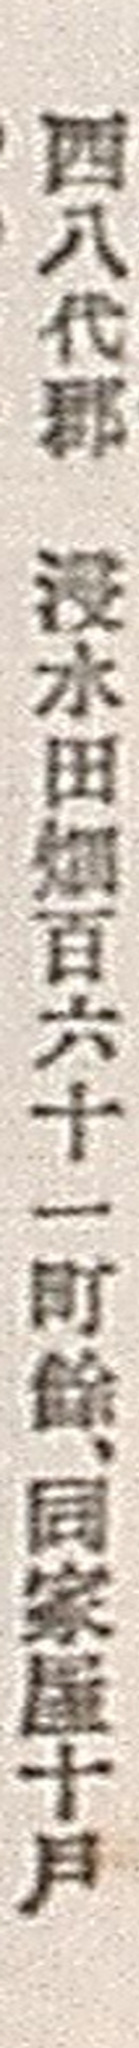西八代郡浸水田畑百六十一町餘、同家屋十戸
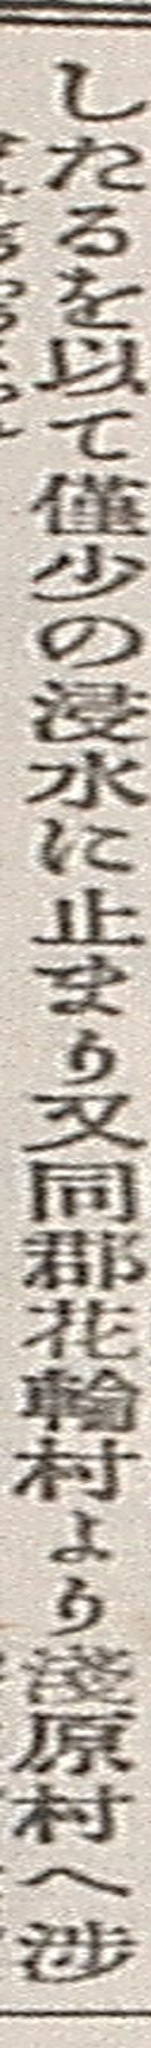したるを以て僅少の浸水に止まり又同郡花輪村より浅原村へ渉
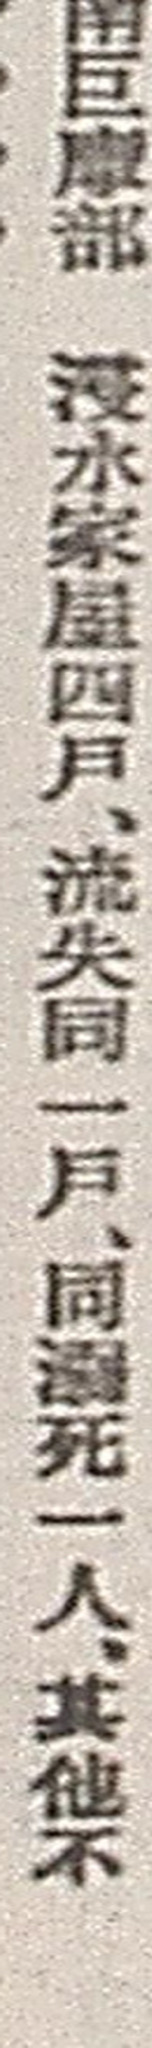南巨摩郡浸水家屋四戸、流失同一戸、同溺死一人、其他不
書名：風俗畫報臨時増刊第百二十八號　洪水被害録（下）
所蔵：東京大学地震研究所図書室 Earthquake Research Institute Library, The University of Tokyo, JAPAN
